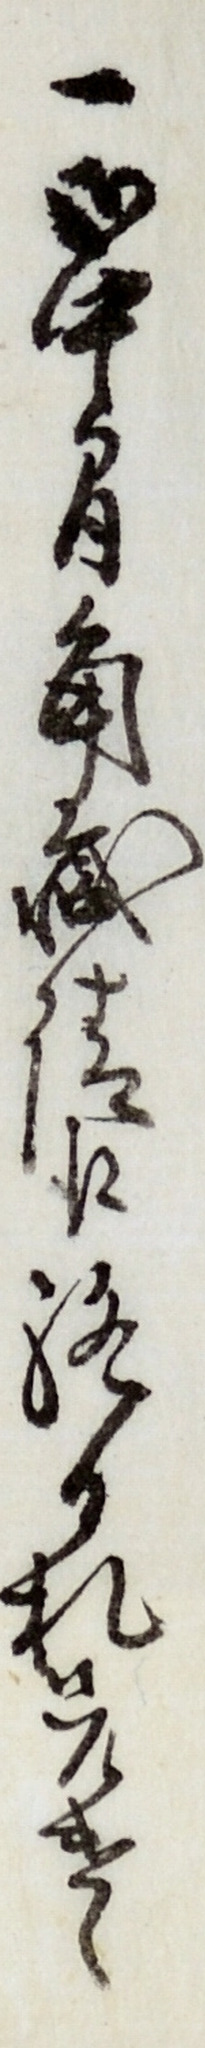一御中間角蔵請取終日札差遣候
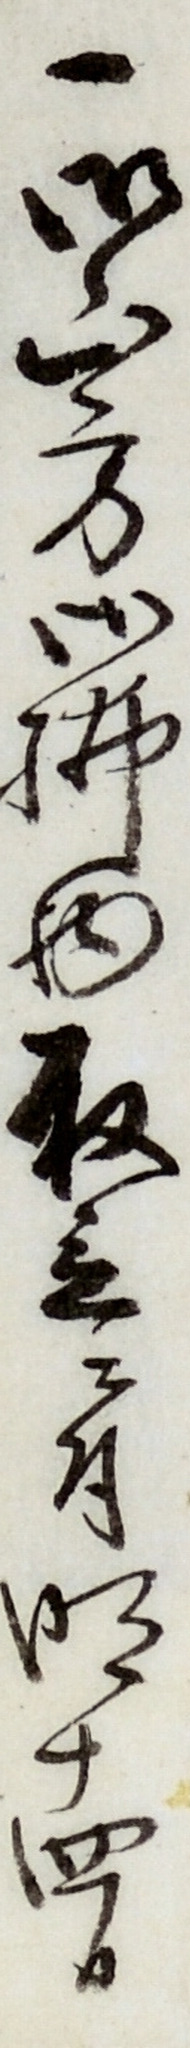一御山方御払物取立ニ付明十四日
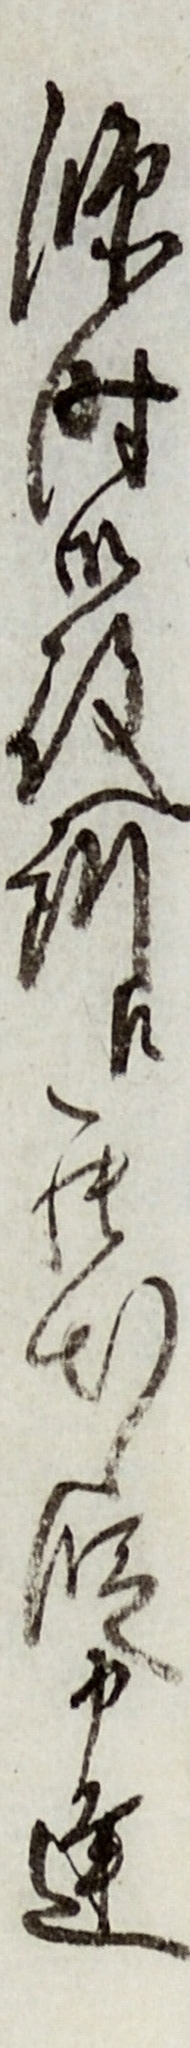臨時御役所江罷出候段申達
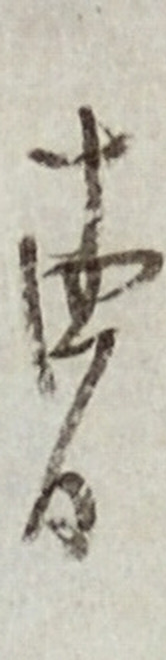十四日
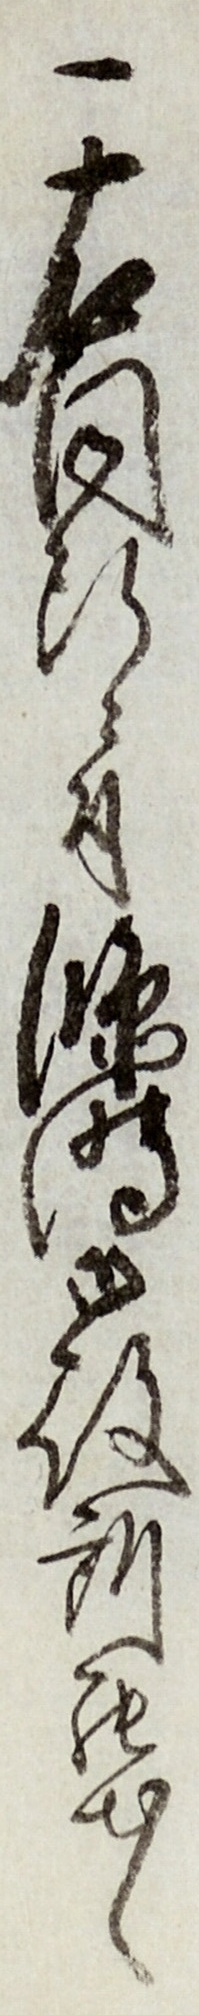一右同断ニ付臨時御役所罷出候
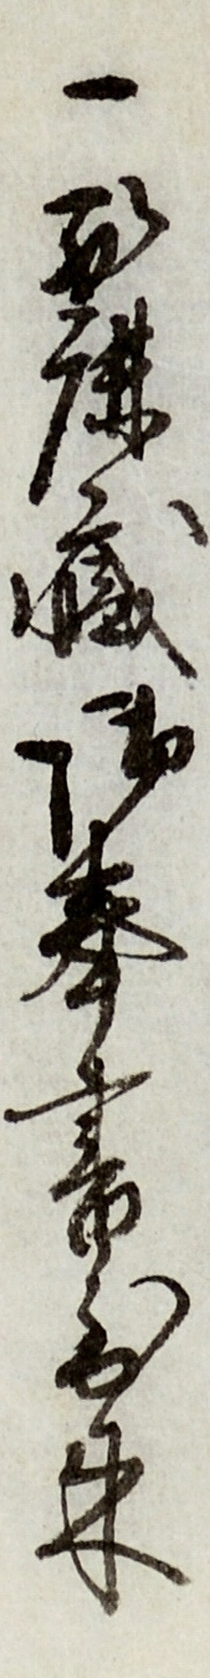一麗蔵御奉書到来
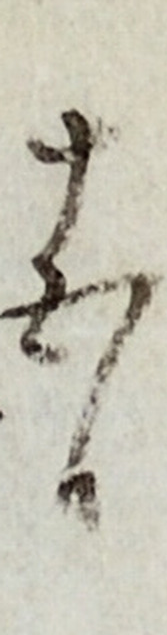十五日
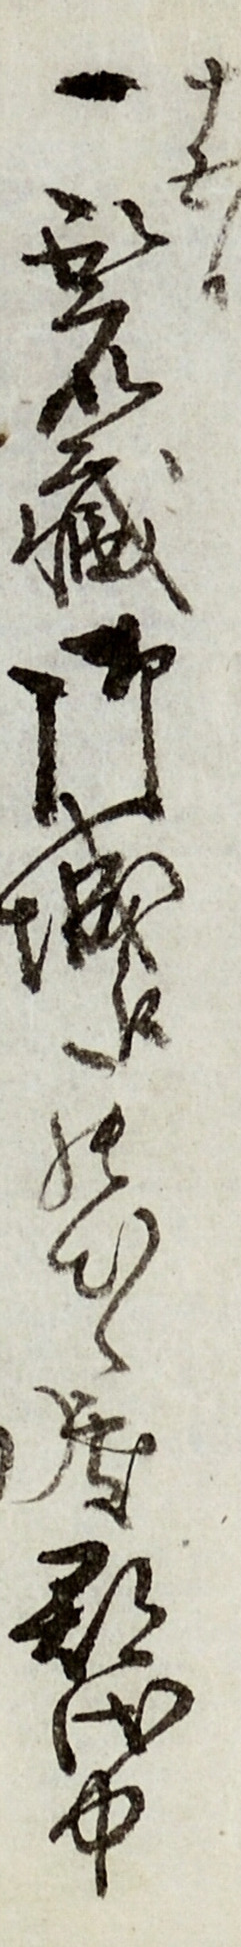一麗蔵御城江罷出候処郡代中
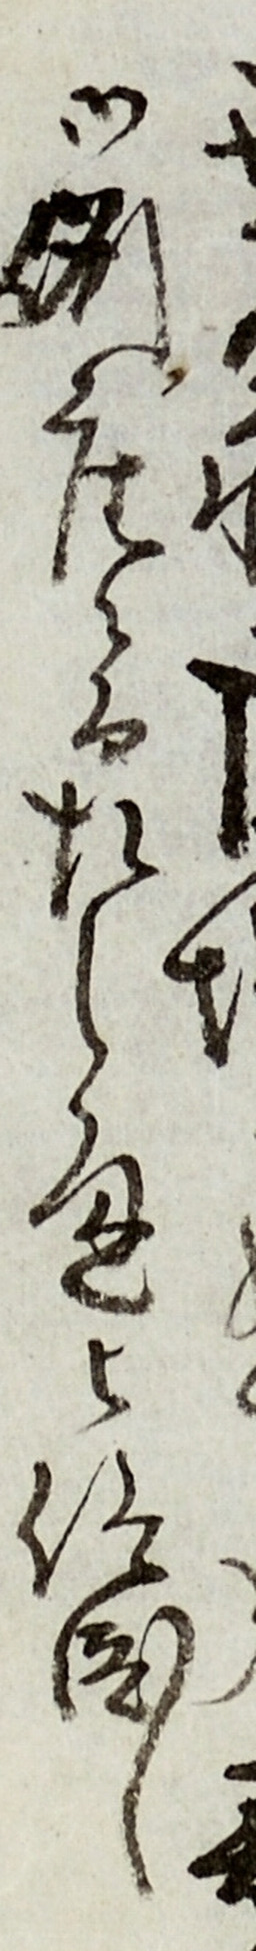御例座ニ而左之通被仰渡候
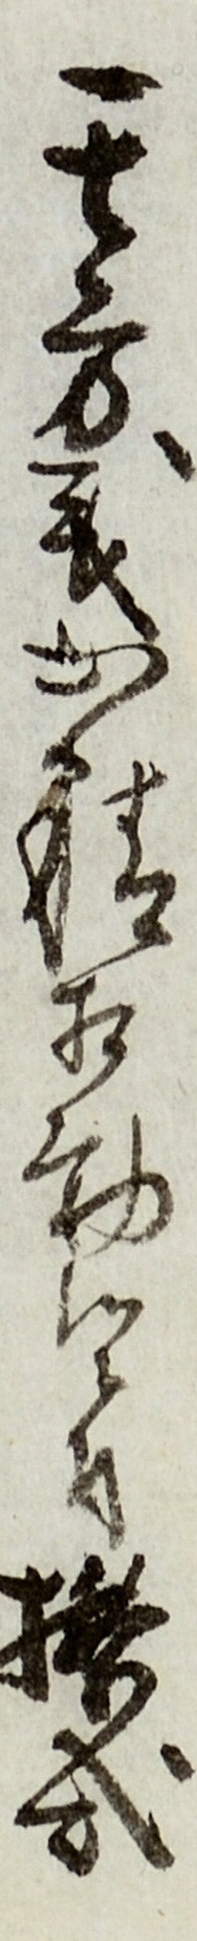其方義出精相勤候ニ付格式
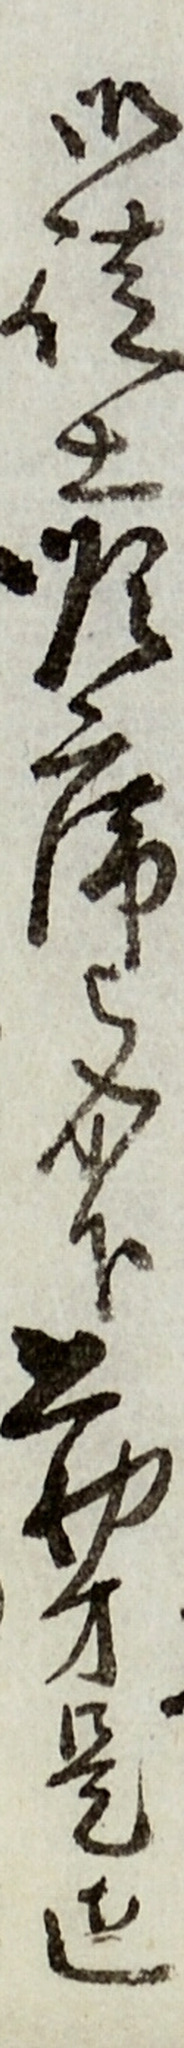御徒士順席被成下勤方是迄
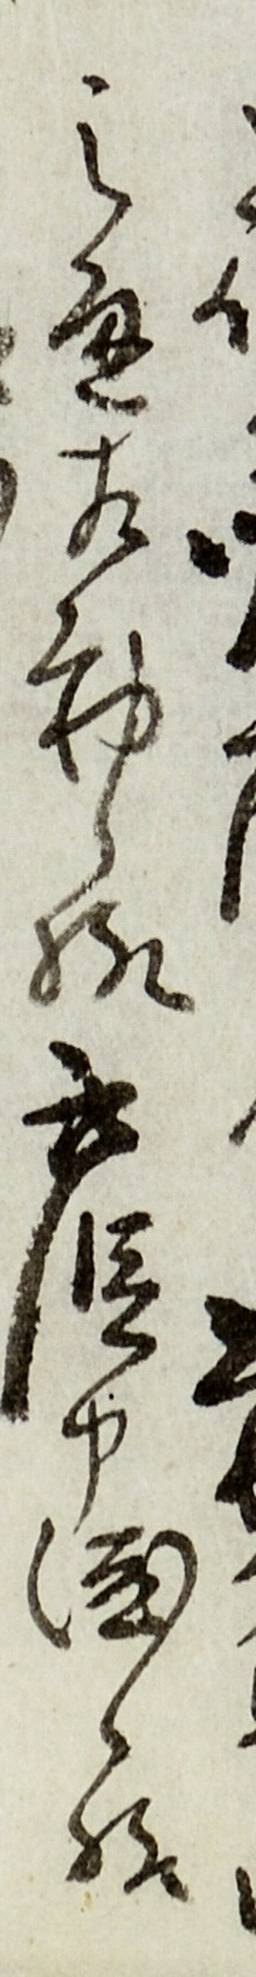之通相勤候様其段申渡候様
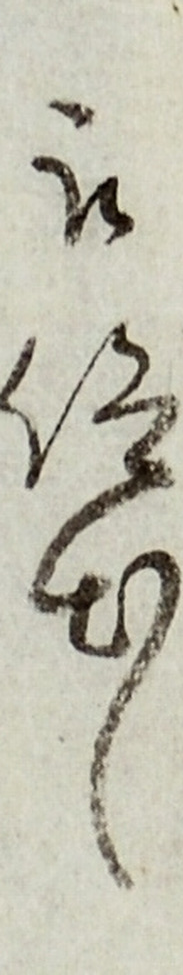被仰出候
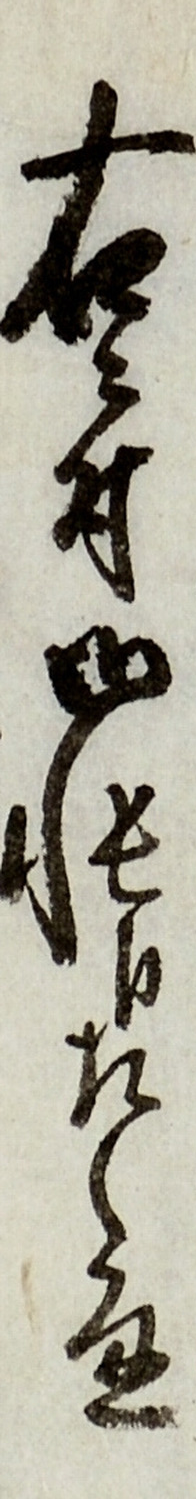右ニ付御帳江左之通
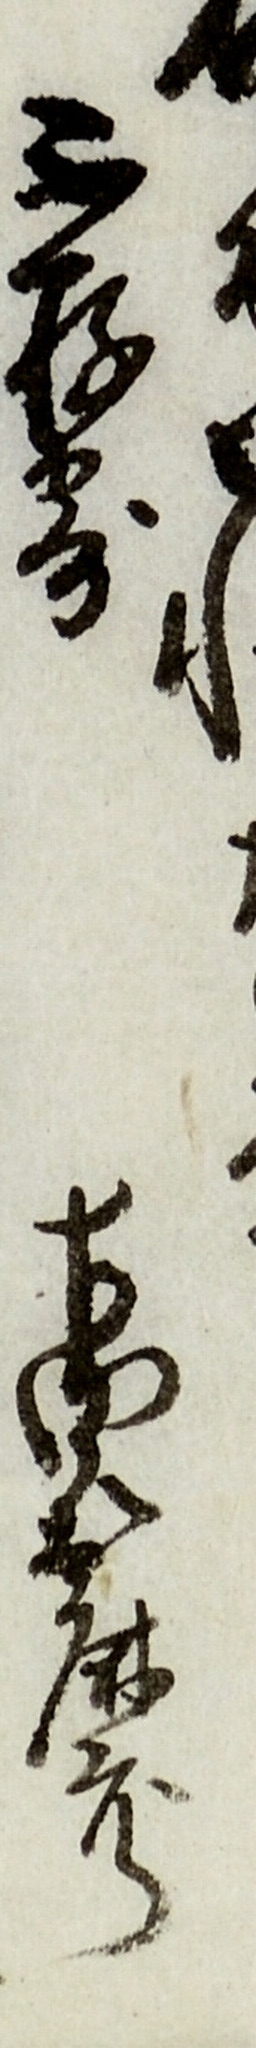不存寄古田麗蔵
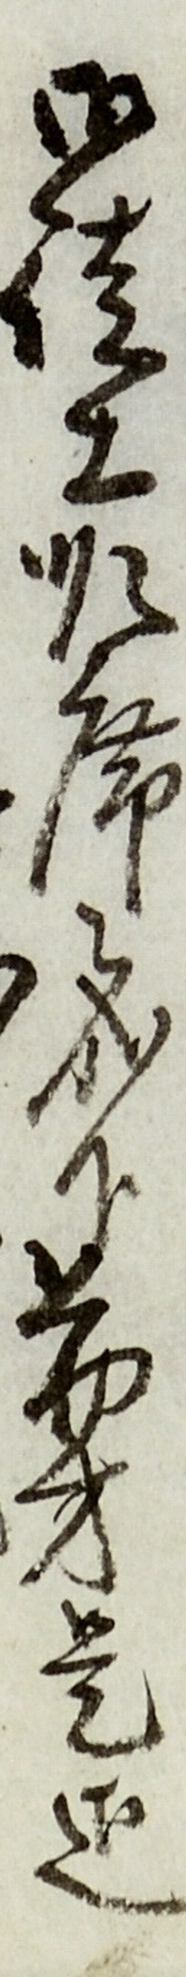御徒士順席被成下勤方是迄
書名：御山方御薪方諸事御用留
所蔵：伊那市立高遠町図書館・合同会社AMANE
